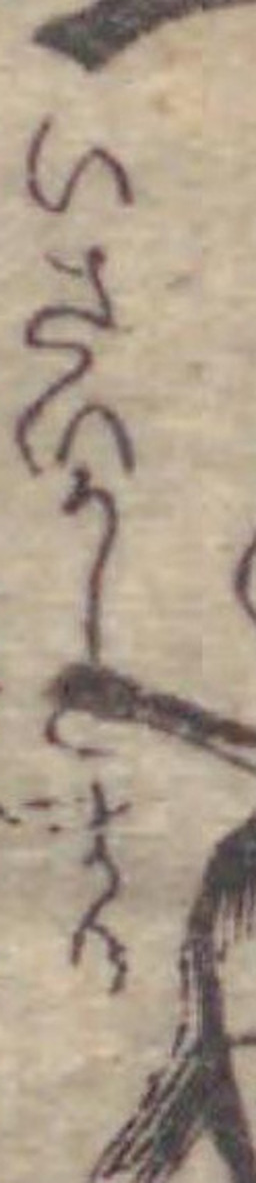いさいかしこまり
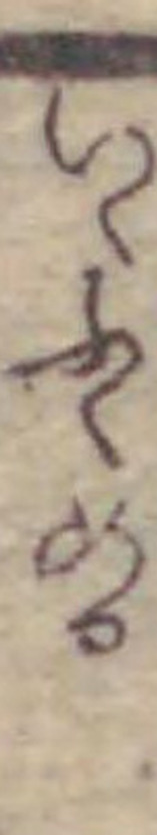いゝふくめる
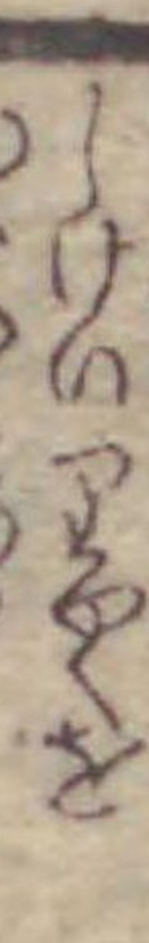しけいりやくを
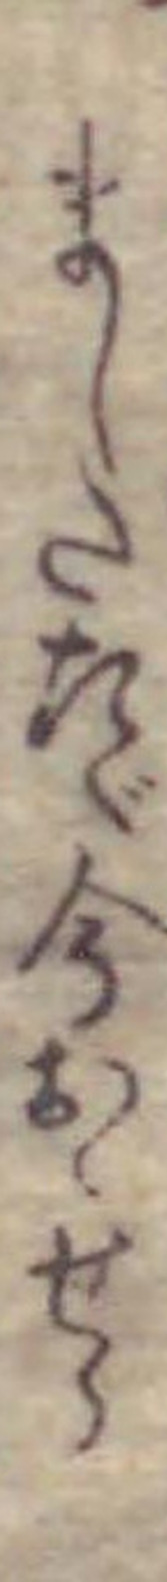ましたたゞ今おゝせら
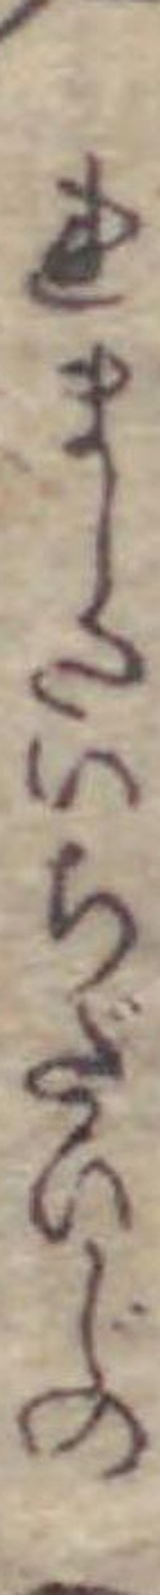れましたいちだいじの
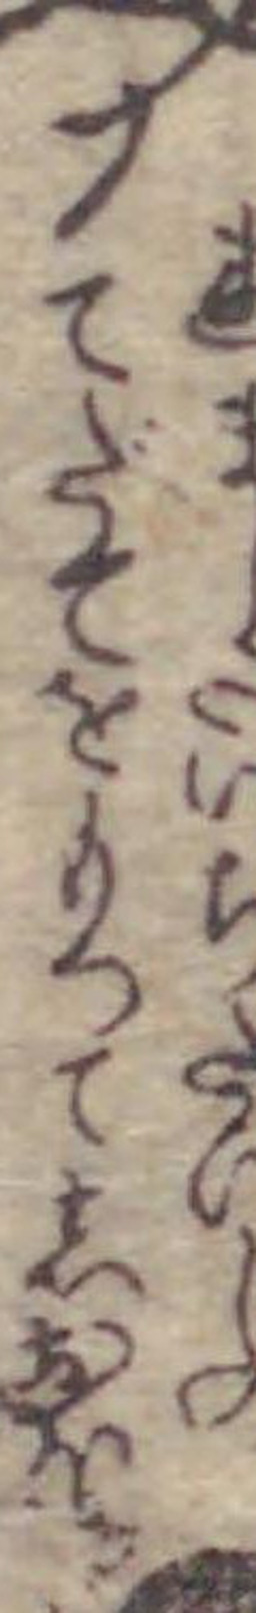てだてをもつてしおほ
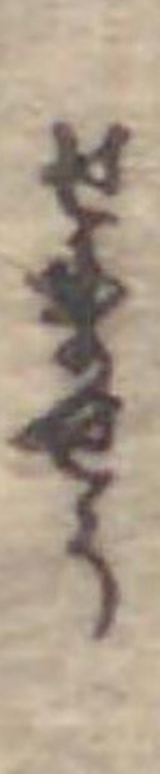せませう
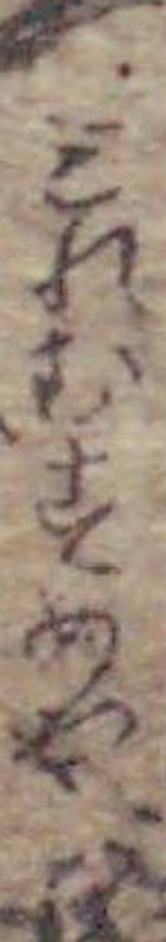これむすめや
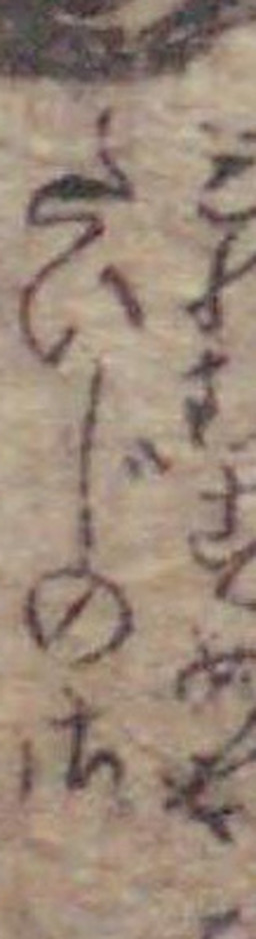たいじの御
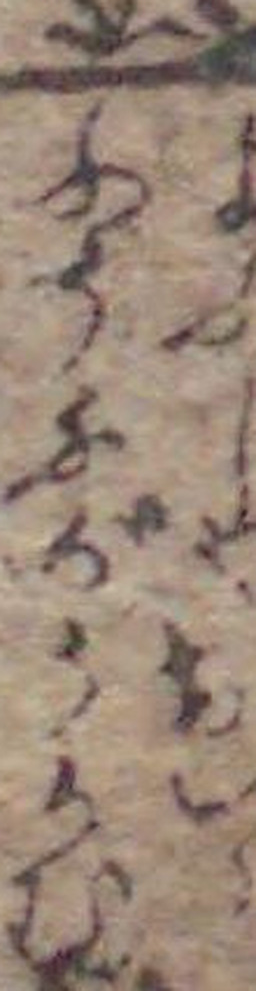ふうふがうかむ
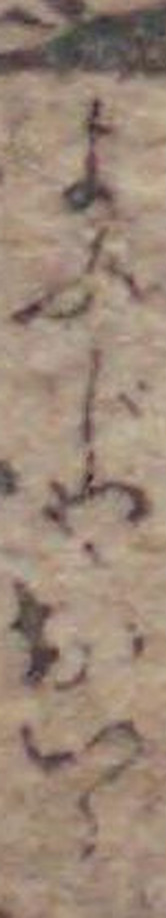よふじやおいら
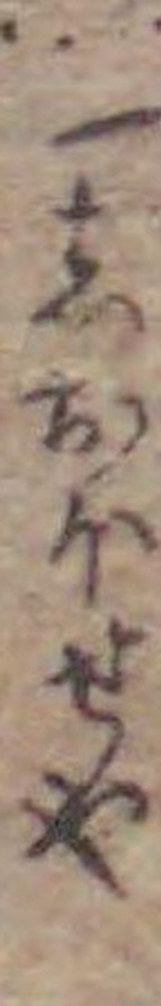しおほせや

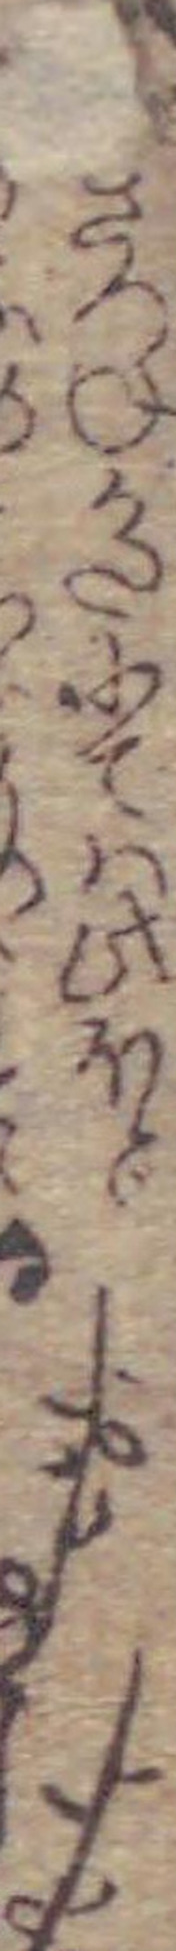きつねがたにては此ほど
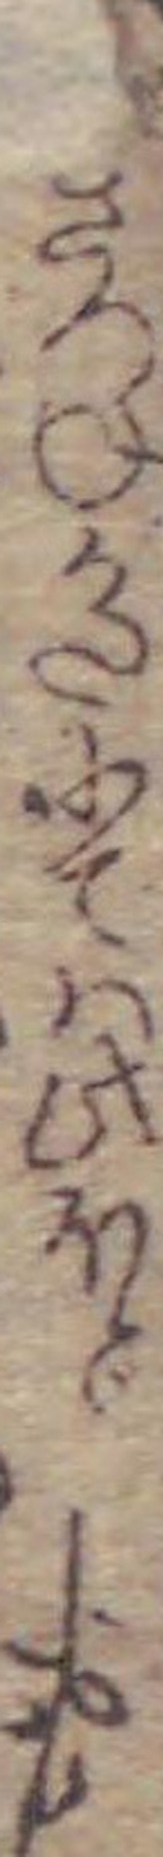きつねがたにては此ほど
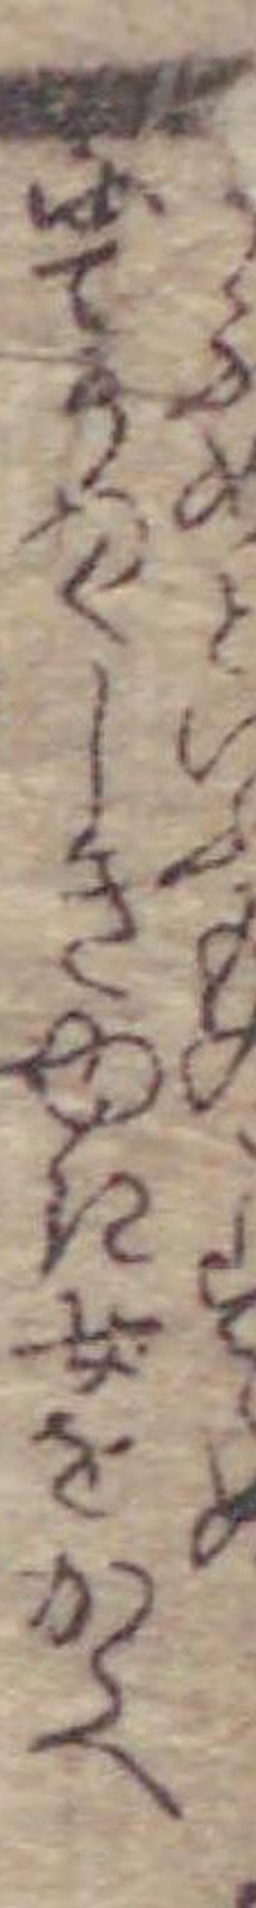にてうつくしきゆき女をかゝへ
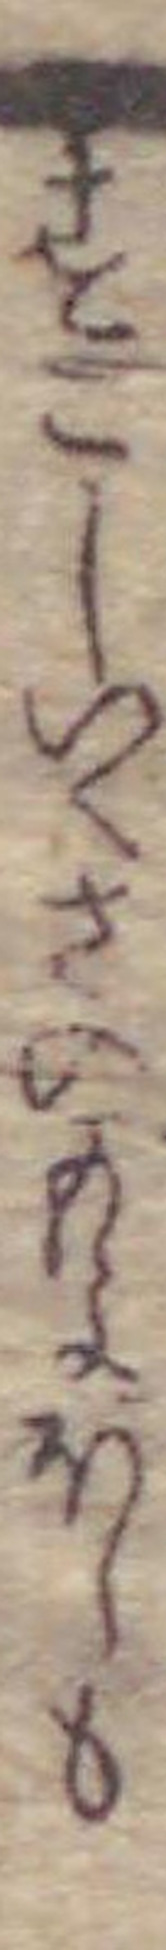すこしいくさのもよほしも
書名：化物仲間破 : 2巻
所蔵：国立国会図書館 National Diet Library, JAPAN
